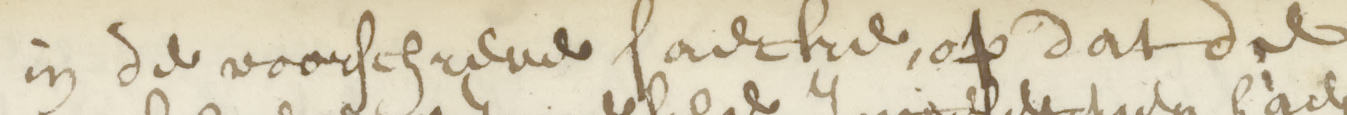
in de voorschreve saecke, op dat de
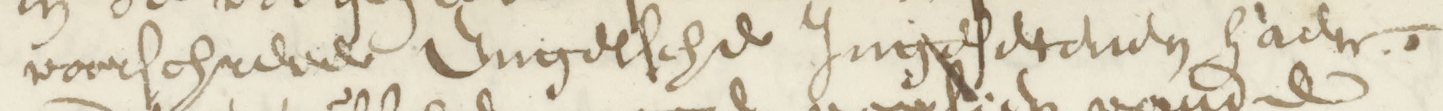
voorschreve Engelsche Ingesetenen haer
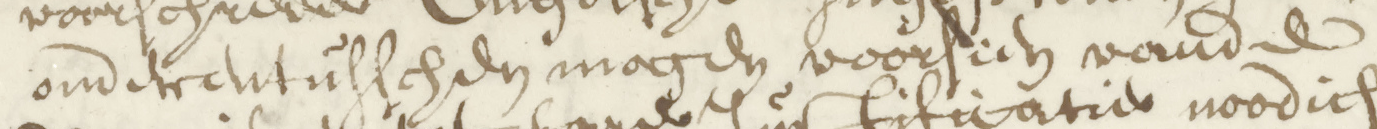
onderentusschen mogen voorsien vande
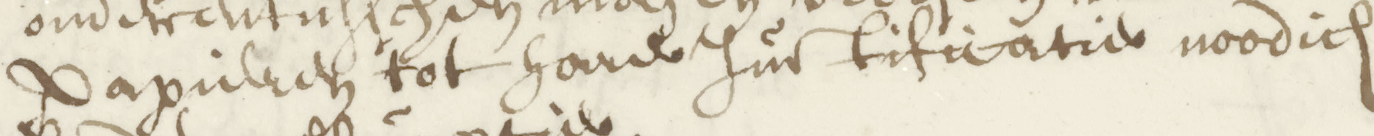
Papieren tot hare Justificatie noodich
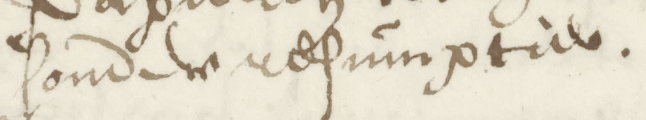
sonder resumptie.
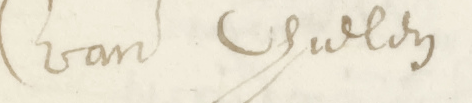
van Thielen
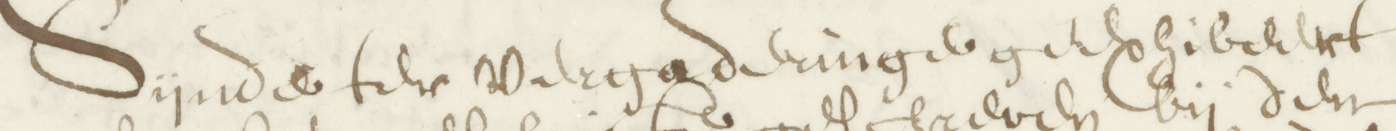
Sijnde ter Vergaderinge geexhibeert
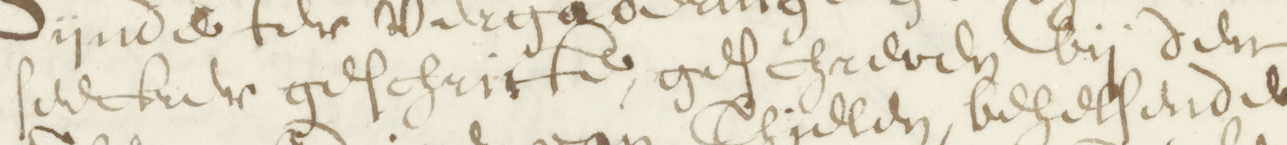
seecker geschrifte geschreven bij den
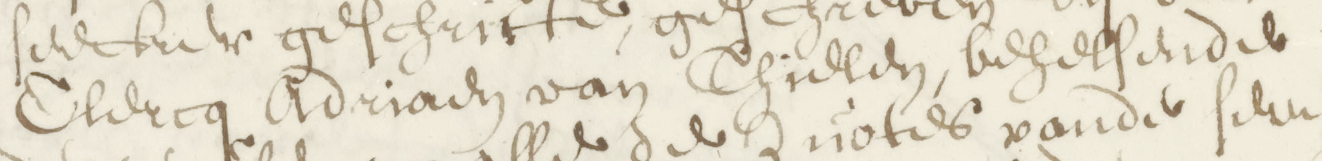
Clercq Adriaen van Thielen, behelsende
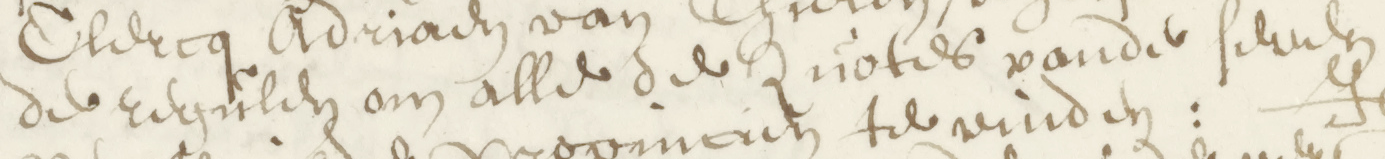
de regulen om alle de Quotes vande seven
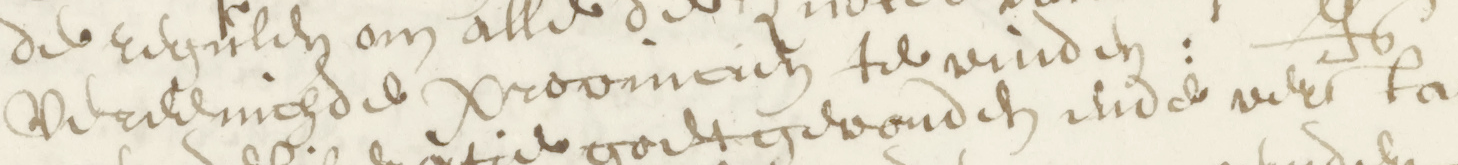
Vereenichde Provincien te vinden: Is
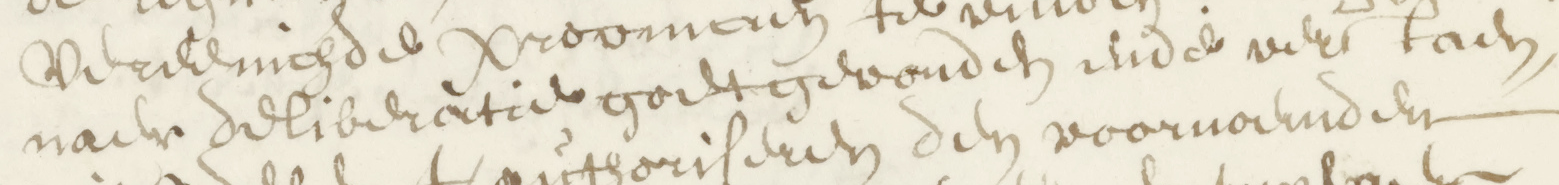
naer deliberatie goetgevonden ende verstaen
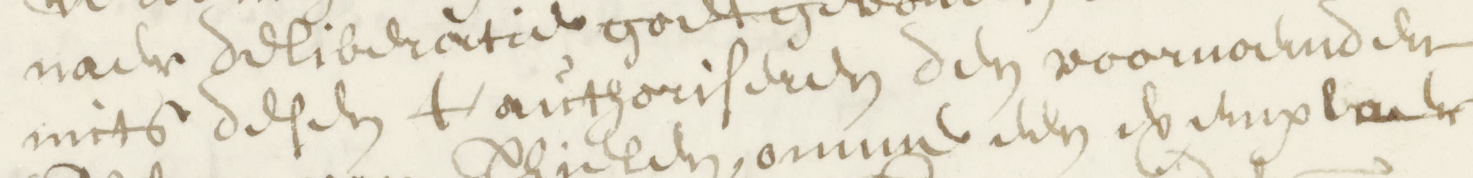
mits desen t'authoriseren den voornoemden
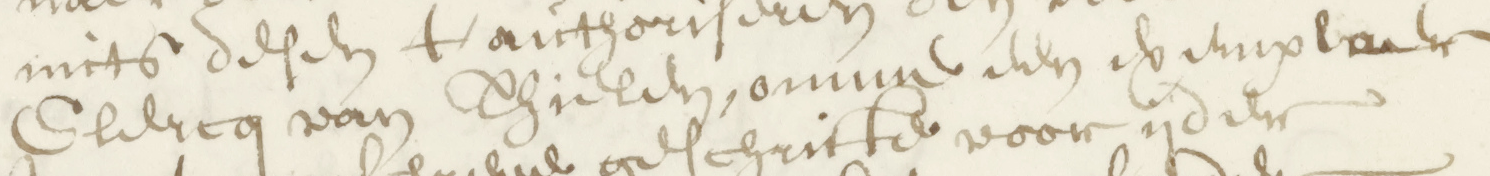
Clercq van Thielen, omme een exemplaer
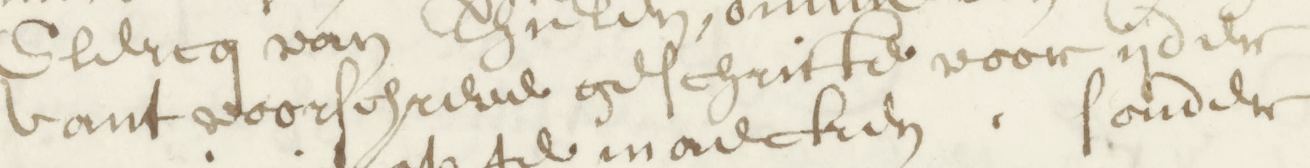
vant voorschreve geschrifte voor ijder
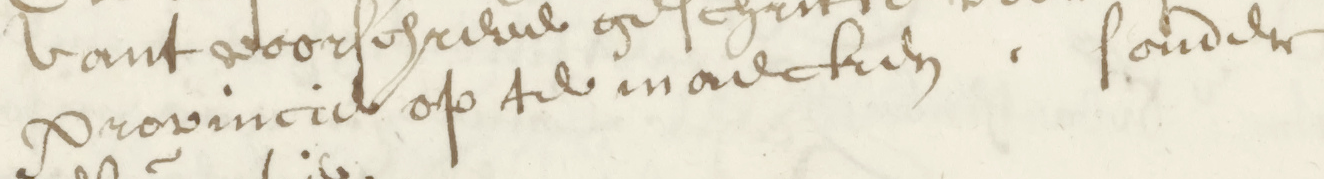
Provincie op te maecken, sonder
